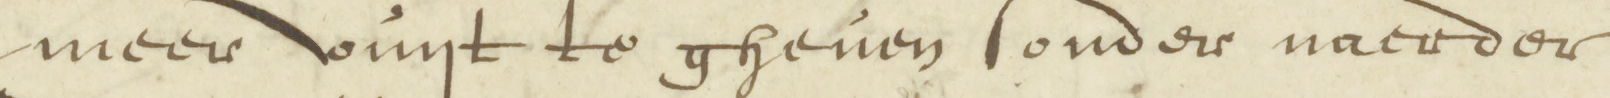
meer vuyt te gheuen sonder naerder
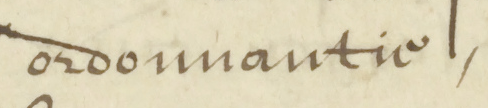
ordonnantie.
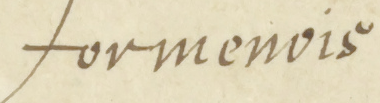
Formenois
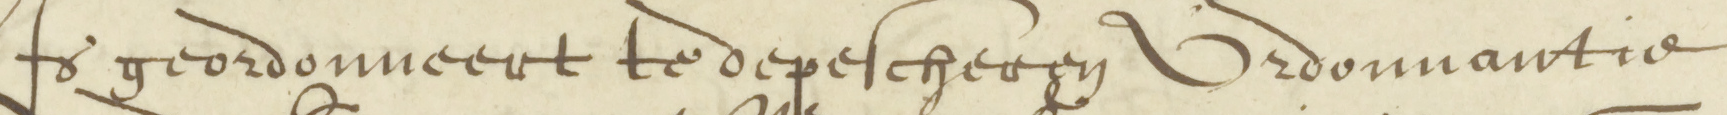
Is geordonneert te depescheren Ordonnantie
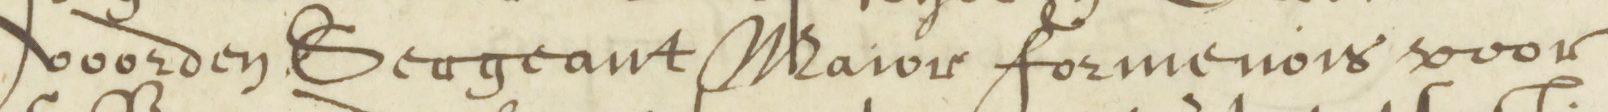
voorden Sergeant Maior Formenois voor
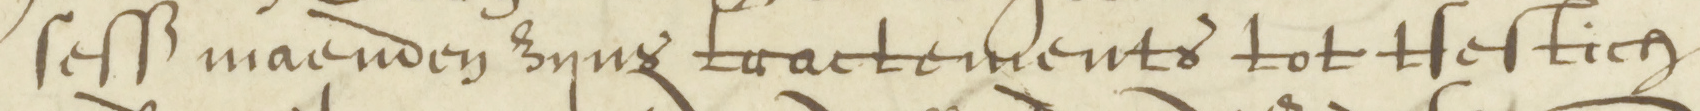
sess maenden zijns tractements tot sestich
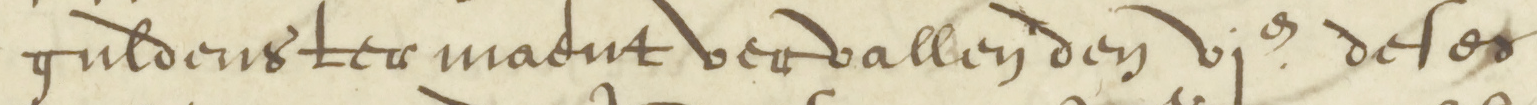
guldens ter maent vervallen den vje deses
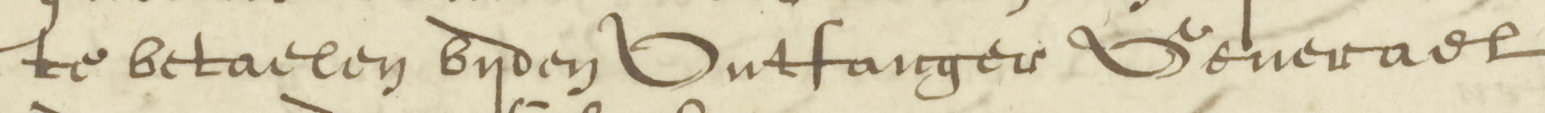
te betaelen byden Ontfanger Generael
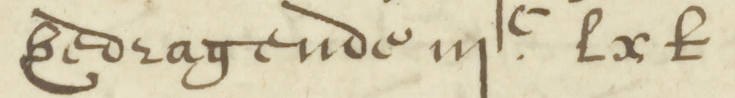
bedragende iije. lxL
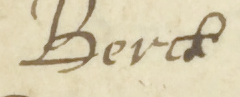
Berck
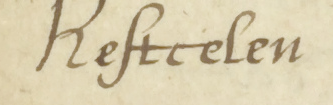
Restcelen
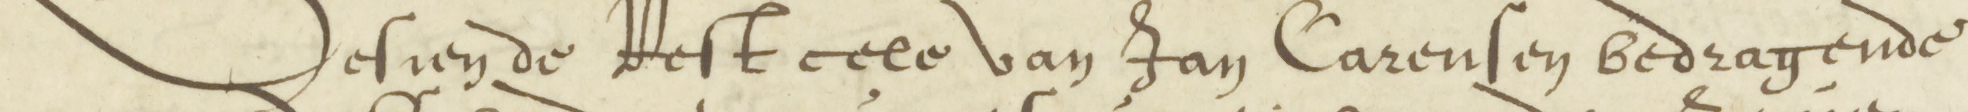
Gesien de Restcele van Jan Carensen bedragende
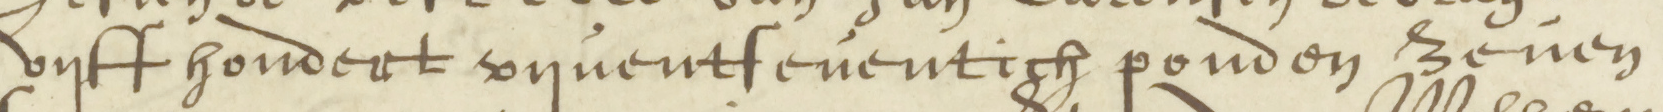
vyff hondert vyuentseuentich ponden zeuen
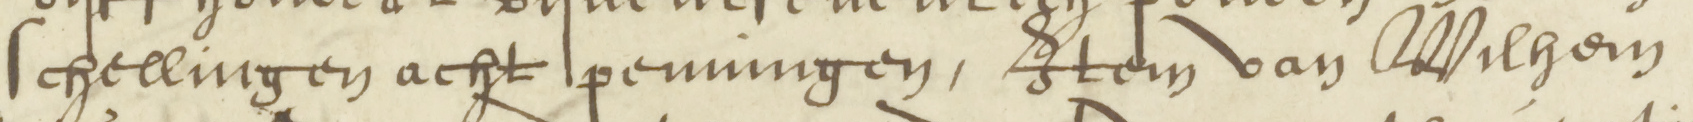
schellingen acht penningen, Item van Wilhem
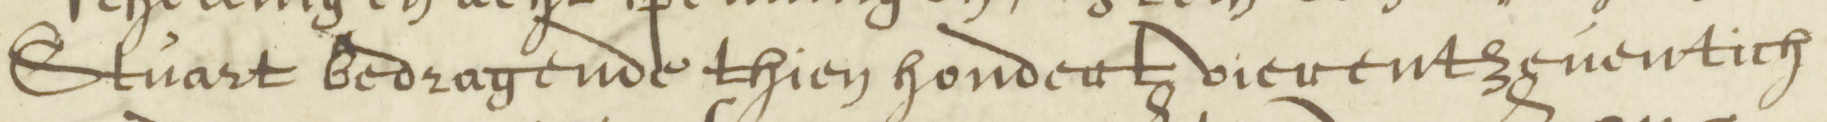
Stuart bedragende thien hondert vierentzeuentich
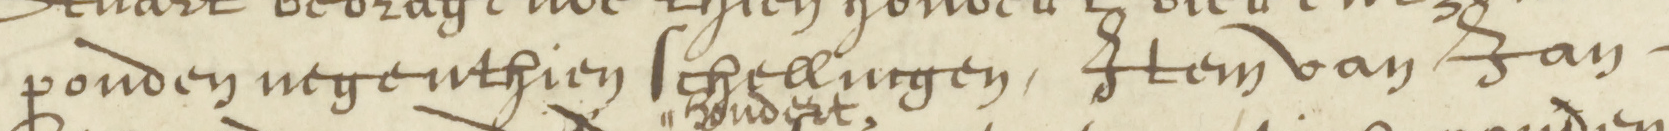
ponden negenthien schellingen, Item van Jan
